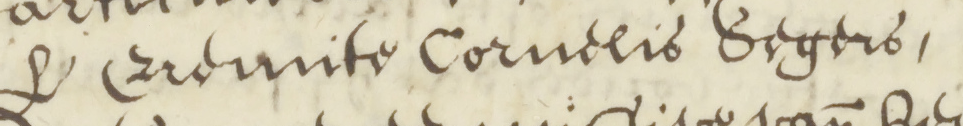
L Eremite Cornelis Segers.
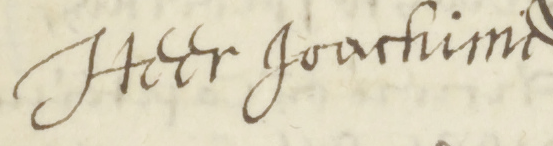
Heer Joachimi
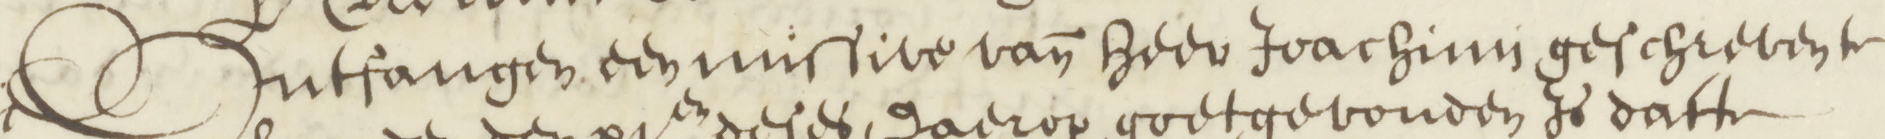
Ontfangen een missive van heer Joachimi geschreven te
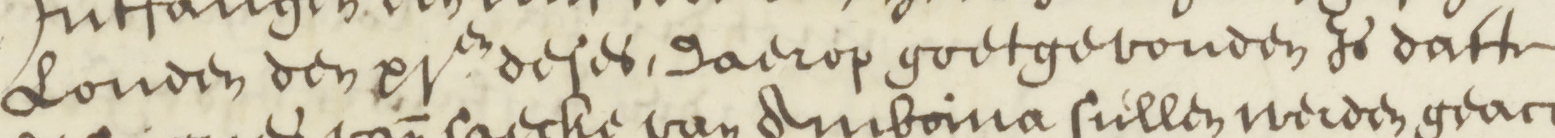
Londen den xien deses, daerop goetgevonden Is datte
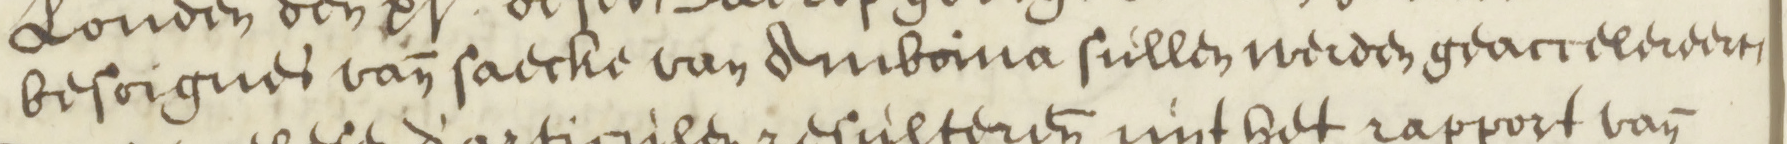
besoignes van saecke van Amboina sullen werden geaccelereert.
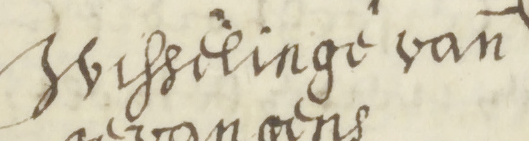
Wisselinge van
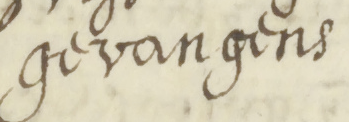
gevangens
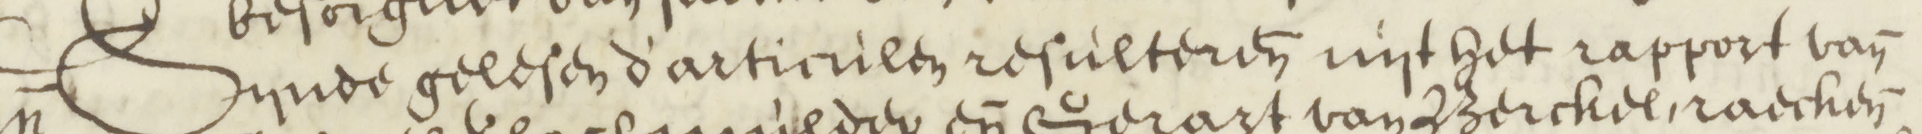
Synde gelesen d'articulen resulteren uyt het rapport van
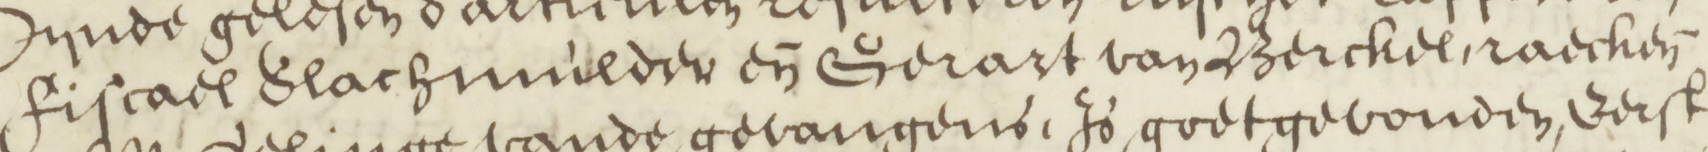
fiscael Slachmulder en Gerart van Berckel, raecken
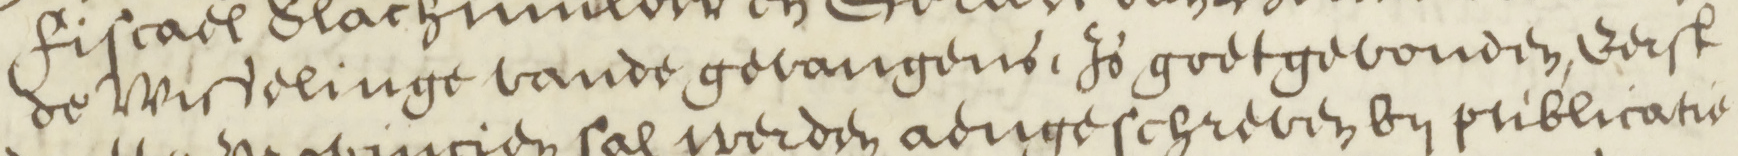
de wisselinge vande gevangens. Is goetgevonden, Eerst
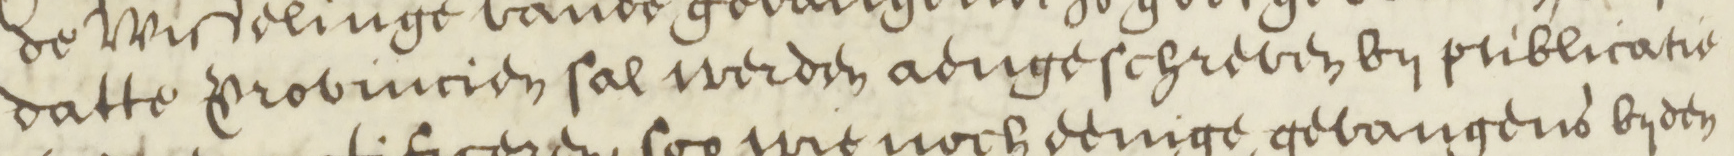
datte provincien sal werden aengeschreven by publicatie
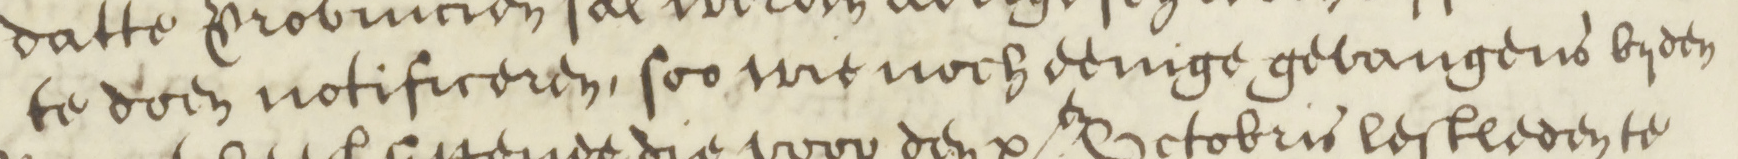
te doen notificeren, soo wie noch eenige gevangens byden
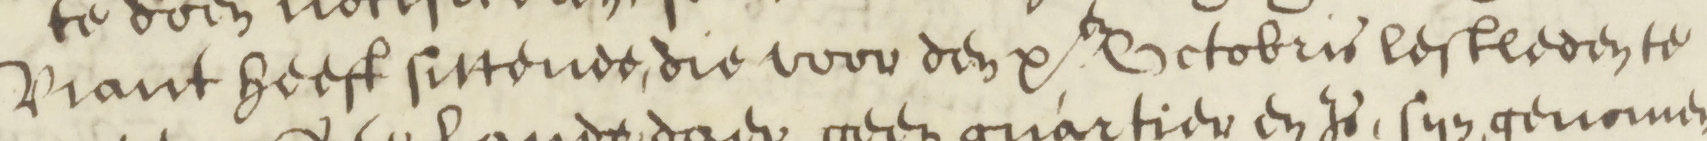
Viant heeft sittende, die voor den xen Octobris lestleden te
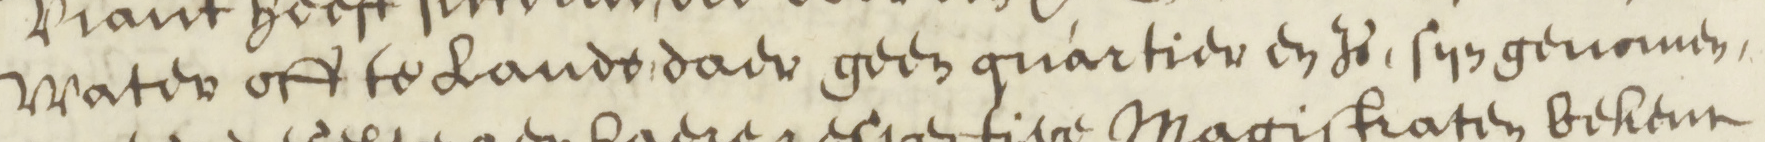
water off te Lande, daer geen quartier en is, syn genomen
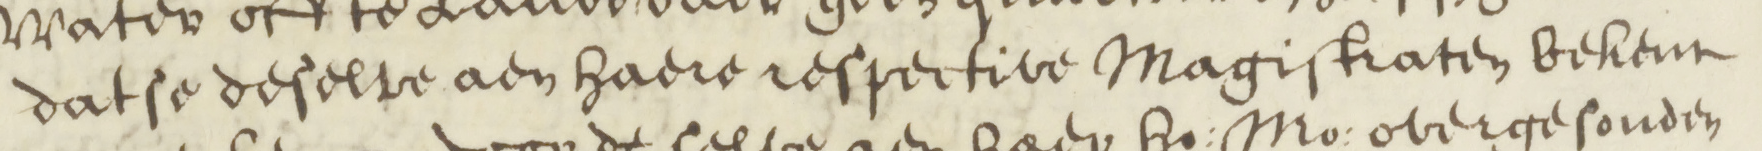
datse deselve aen haere respective magistraten bekent
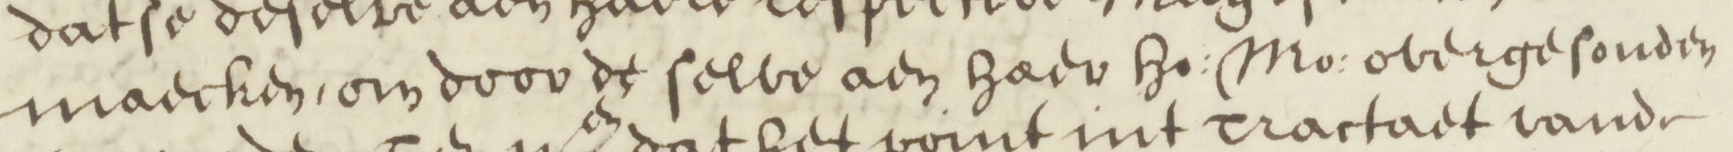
maecken, om door de selve aen haer Ho:Mo: overgesonden
